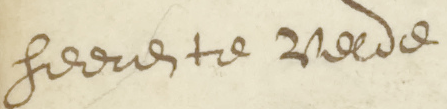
heeren te Velde
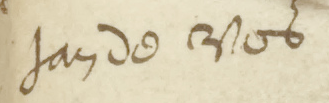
Jan de Vos.
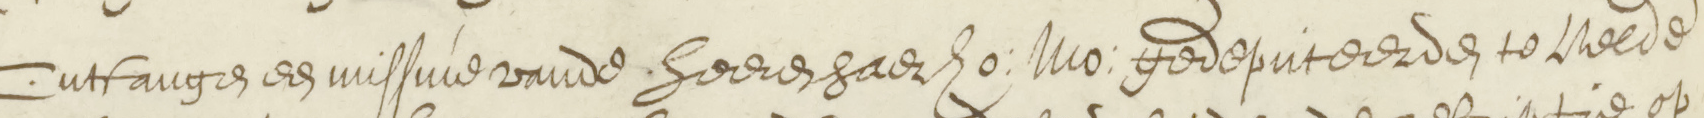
Ontfangen een missiue vande heeren haer ho:Mo: gedeputeerden te Velde
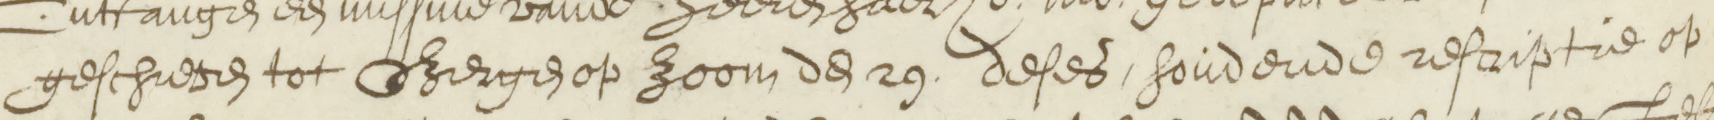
geschreven tot Bergen op Zoom den 29. deses, houdende rescriptie op
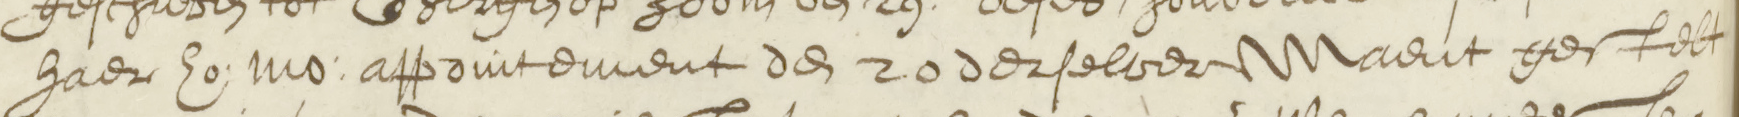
haer ho:mo: appointement den 20 derselver Maent gestelt
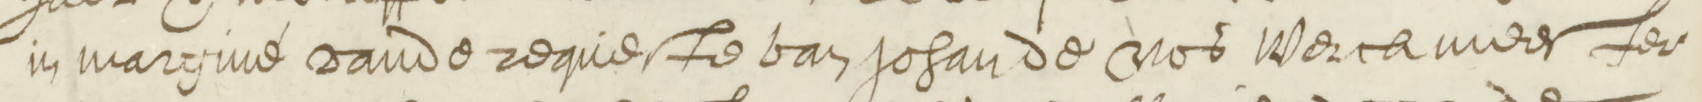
in margine vande requeste van Johan de Vos Werckmeester
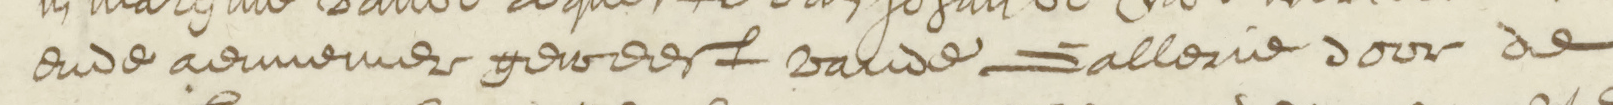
ende aennemer geweest vande Gallerie door de
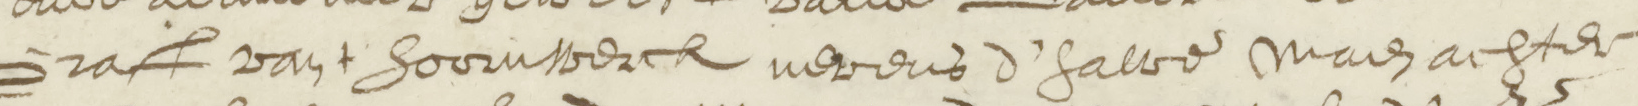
Graft vant' hoornwerck nevens d' halve maen achter
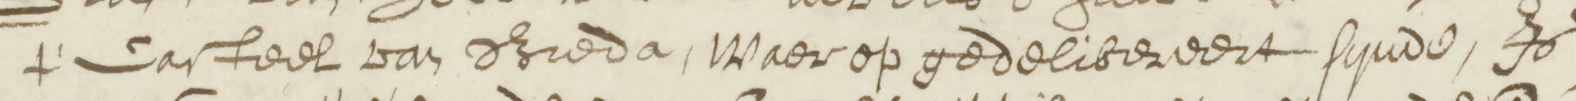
t' Casteel van Breda, Waer op gedelibereert synde, Is
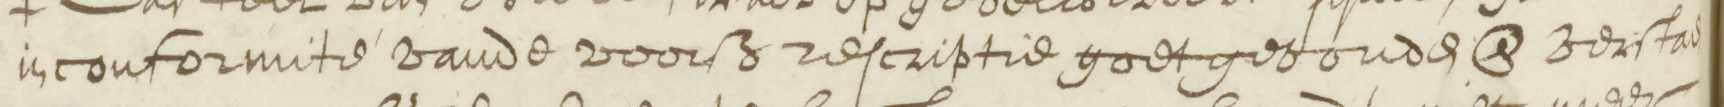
in conformité vande voors rescriptie goetgevonden & verstaen
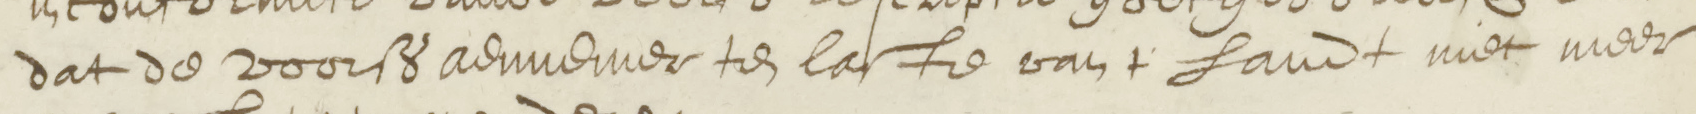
dat de voors aennemer ten laste van t' Landt niet meer
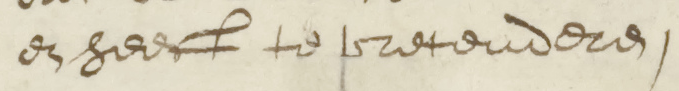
en heeft te pretenderen.
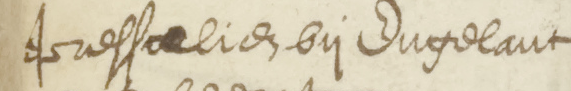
repressalien bij Engelant
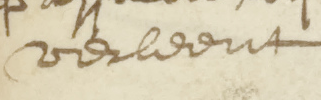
verleent
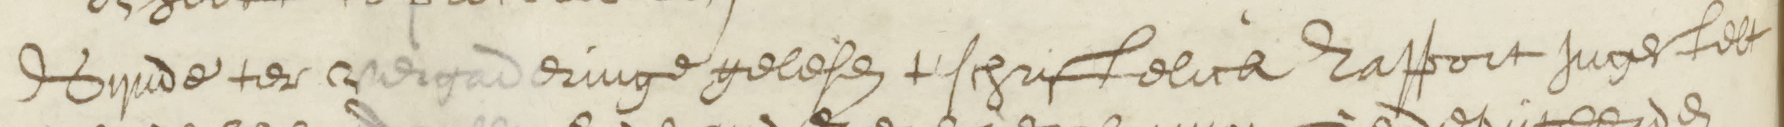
Synde ter vergaderinge gelesen t'schriftelick rapport Ingestelt
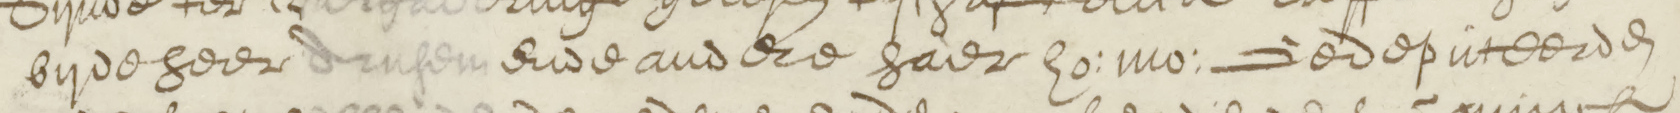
byde heer Arnhem ende andere haer ho:mo: Gedeputeerden
